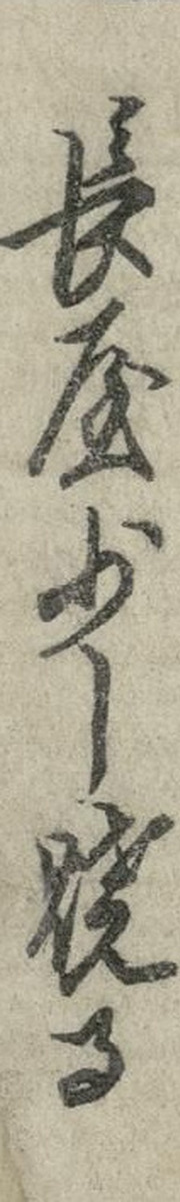長屋少し焼る
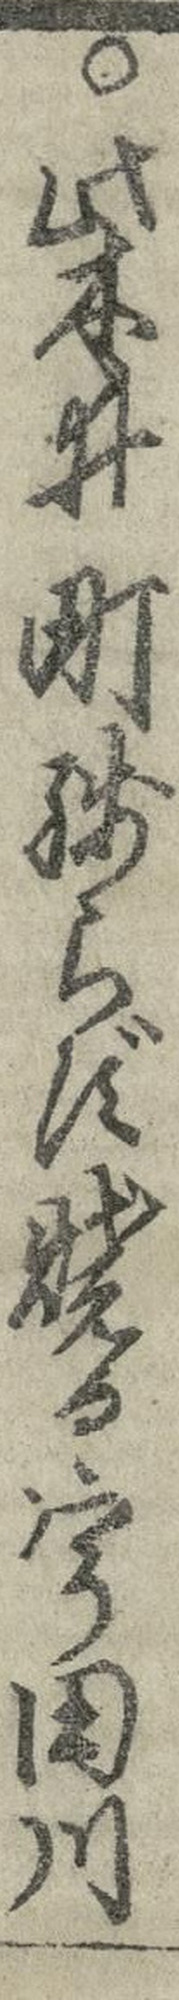○柴井町残らず焼る宇田川
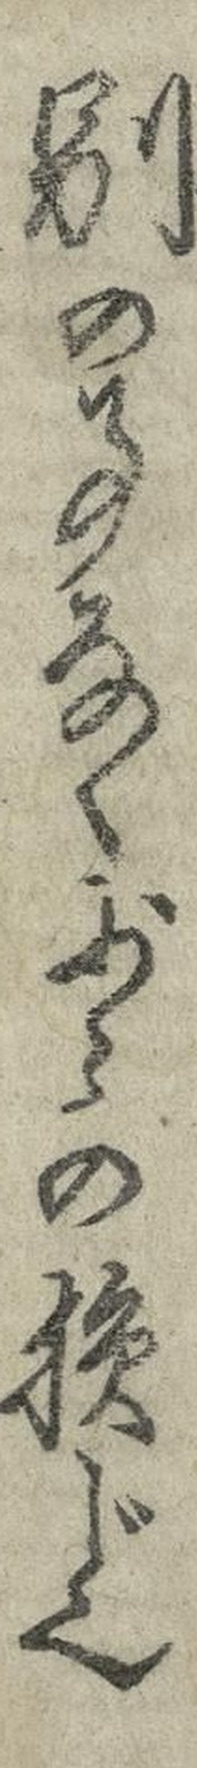別の事なく少々の損じ也
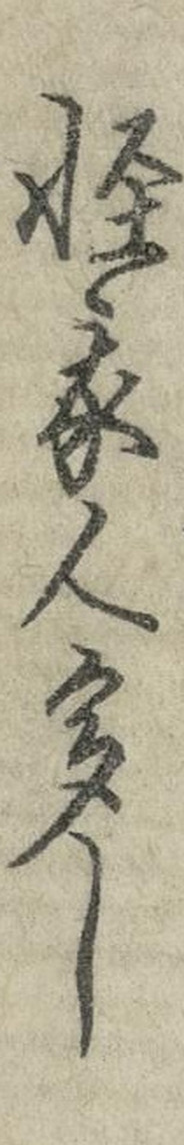怪我人多し
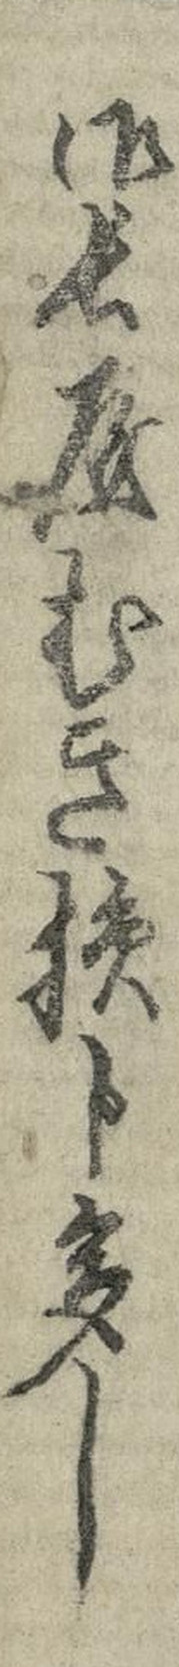御長屋むき損じ多し
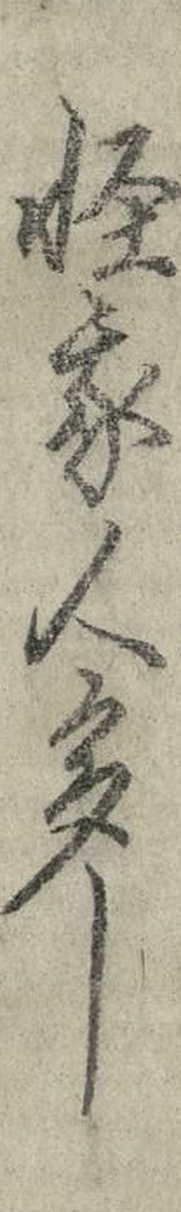怪我人多し
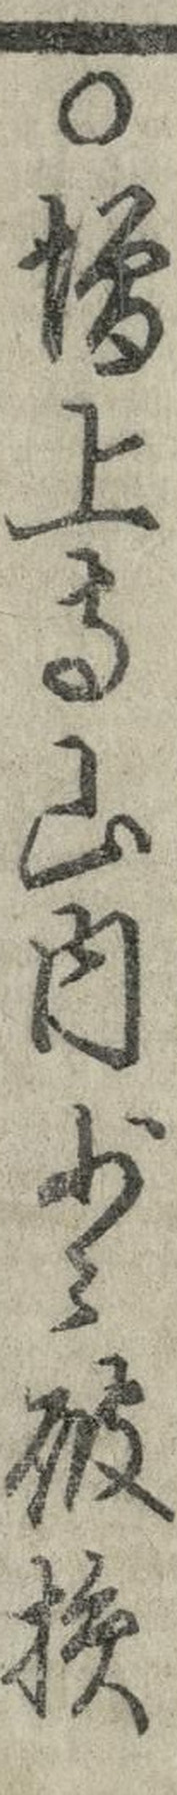○増上寺山内少々破損
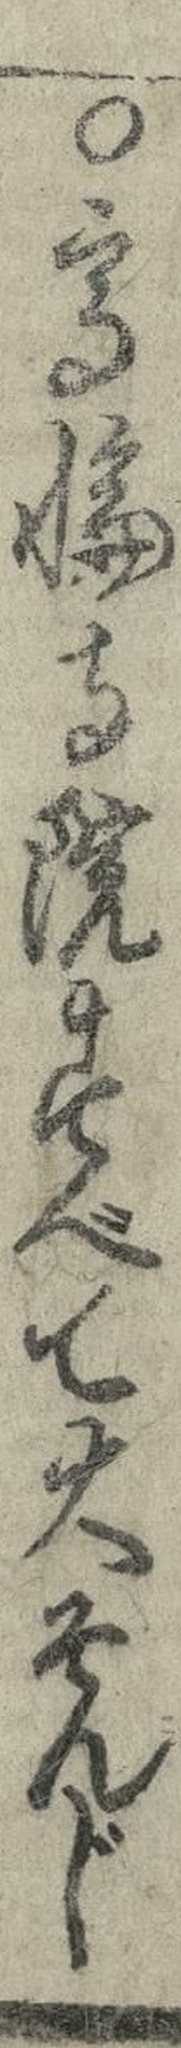○高輪寺院すべて大そんじ
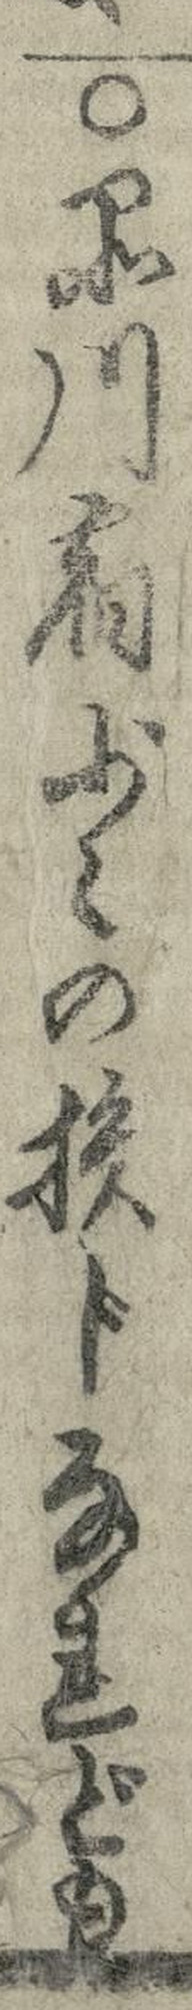○品川宿少々の損じなれども
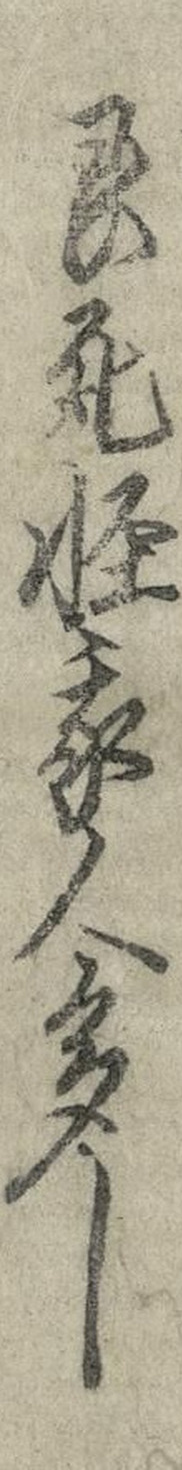即死怪我人多し
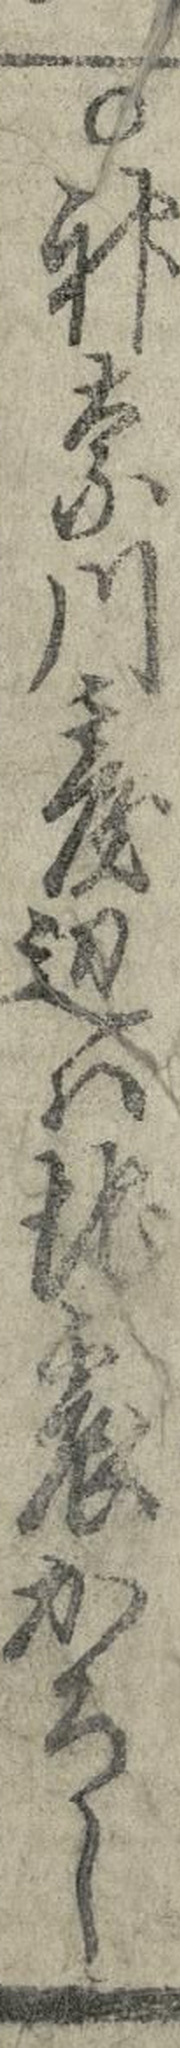○神奈川台辺は地震かろし

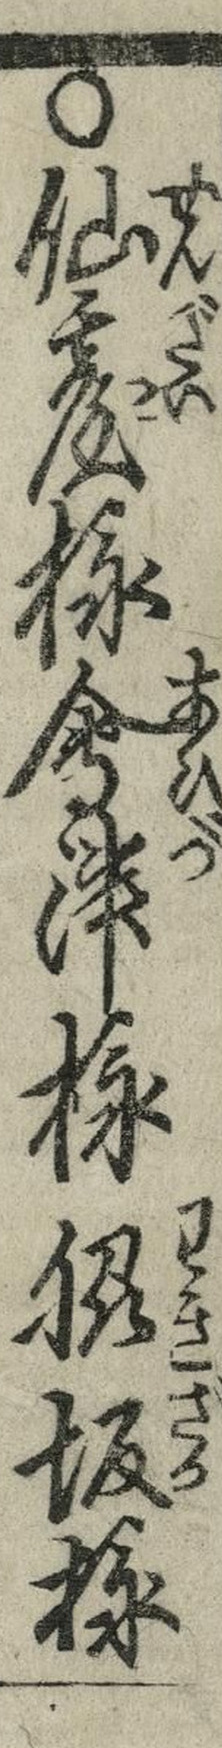○仙台様会津様脇坂様
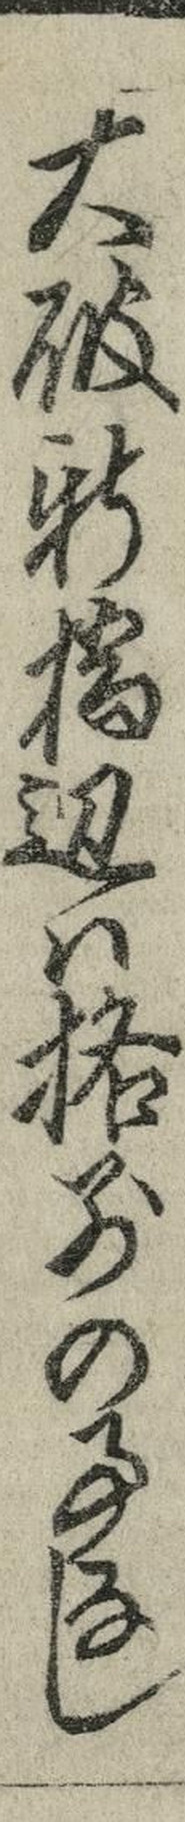大破新橋辺は格別の事なし
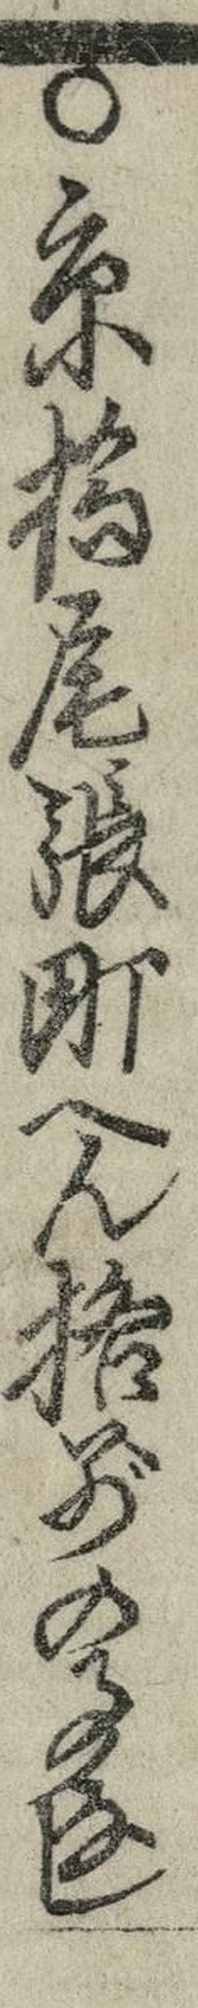○京橋尾張町へん格別の事なし
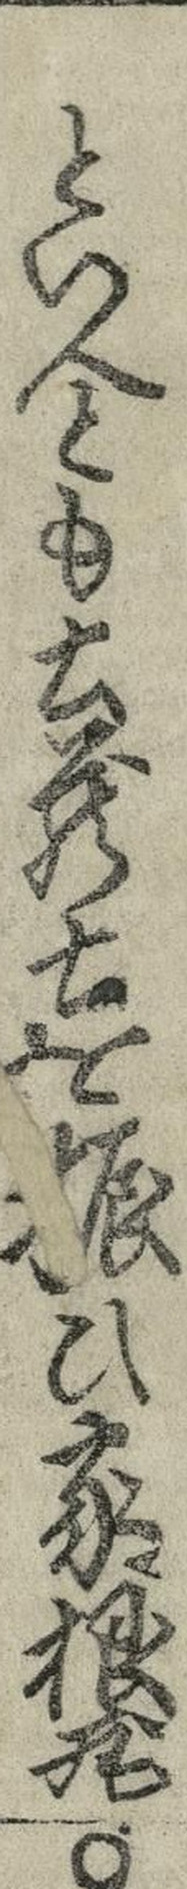といへとも土蔵土を振ひ家根瓦
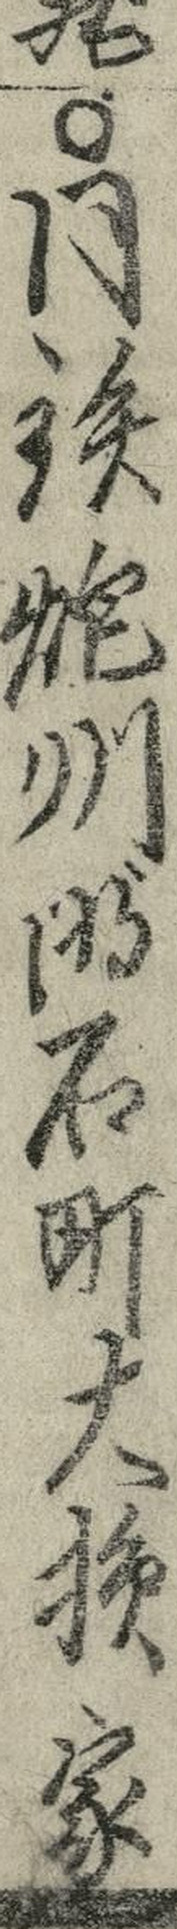○同鉄炮州明石町大損家
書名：江戸　大地震末代噺の種　全
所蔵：東京大学地震研究所図書室 Earthquake Research Institute Library, The University of Tokyo, JAPAN
